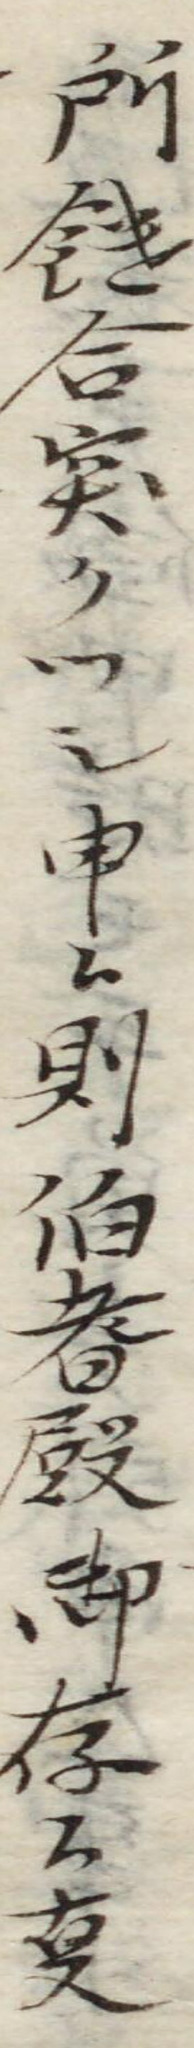所鑓合突クツシ申候則伯耆殿御存候事
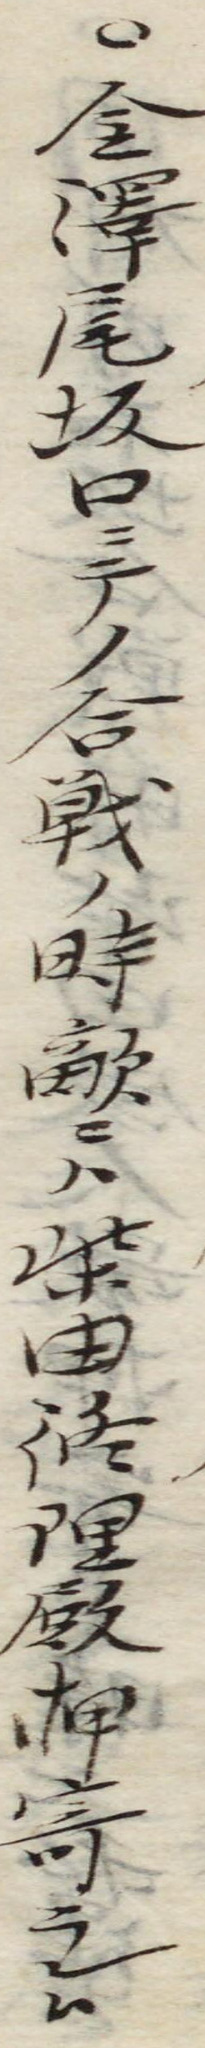〇金澤尾坂口ニテノ合戦ノ時敵ニハ柴田修理殿押寄ラレ候
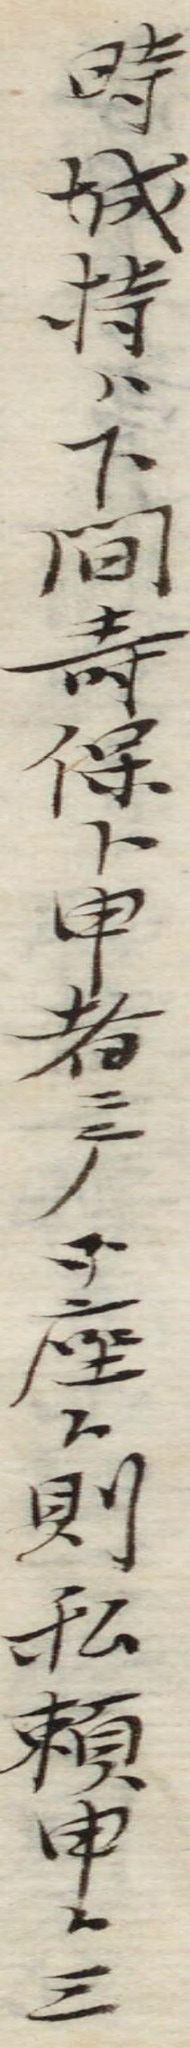時城持ハ下間寿保ト申者ニテ御座候則私頼申候三
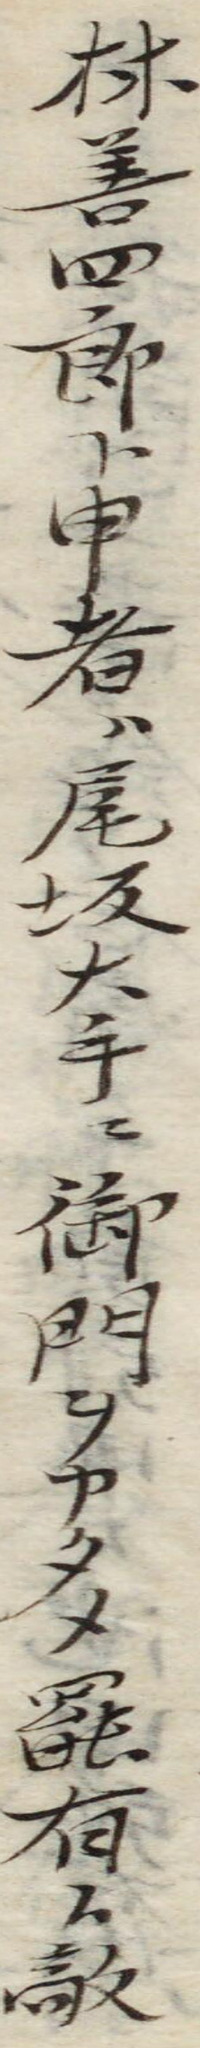林善四郎ト申者ハ尾坂大手ニ御門ヲカタメ罷有候敵
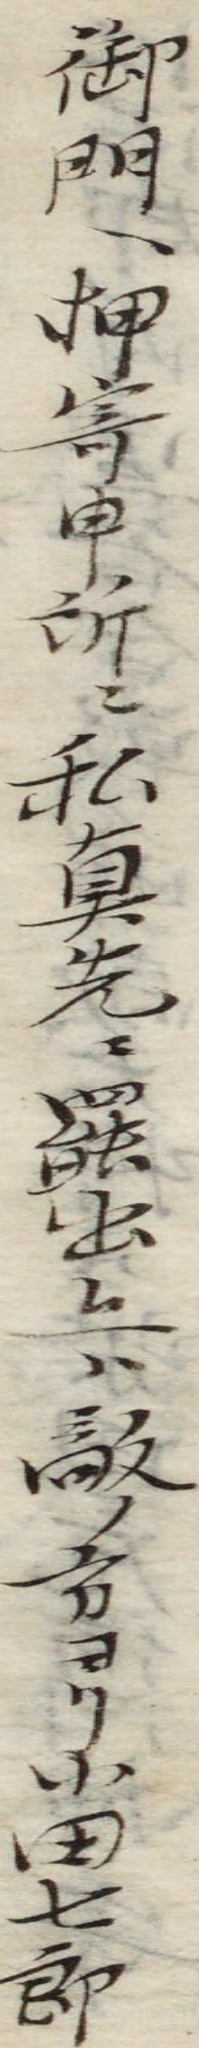御門へ押寄申所ニ私真先ニ罷出候へハ敵ノ方ヨリ小田七郎
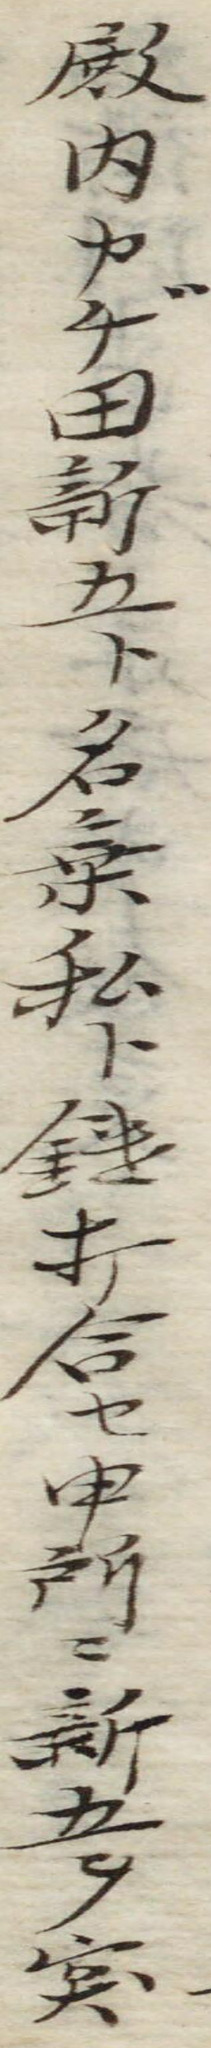殿内カヂ田新五ト名乗私ト鑓打合セ申所ニ新五ヲ突
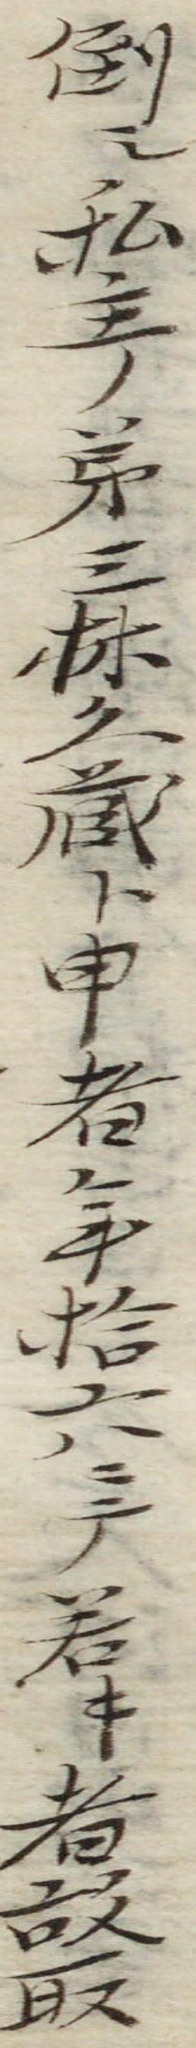倒シ私主ノ弟三林久蔵ト申者年拾六二テ若キ者故取
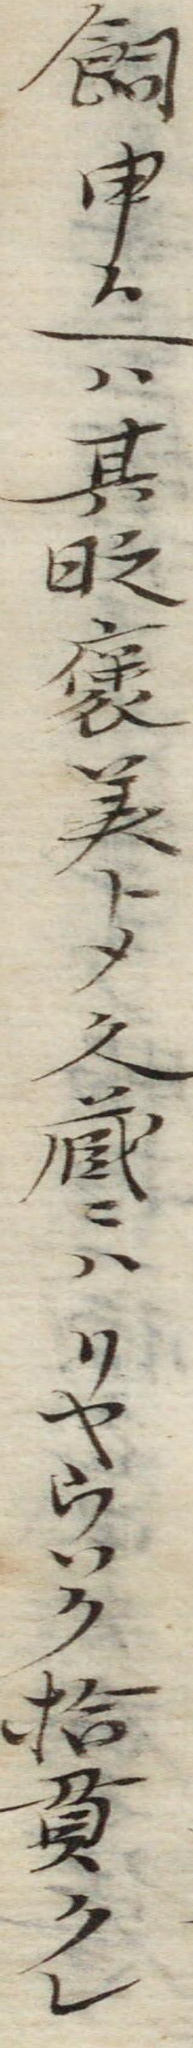飼申候へハ其眨褒美トメ久蔵ニハリヤウハク拾貫クレ

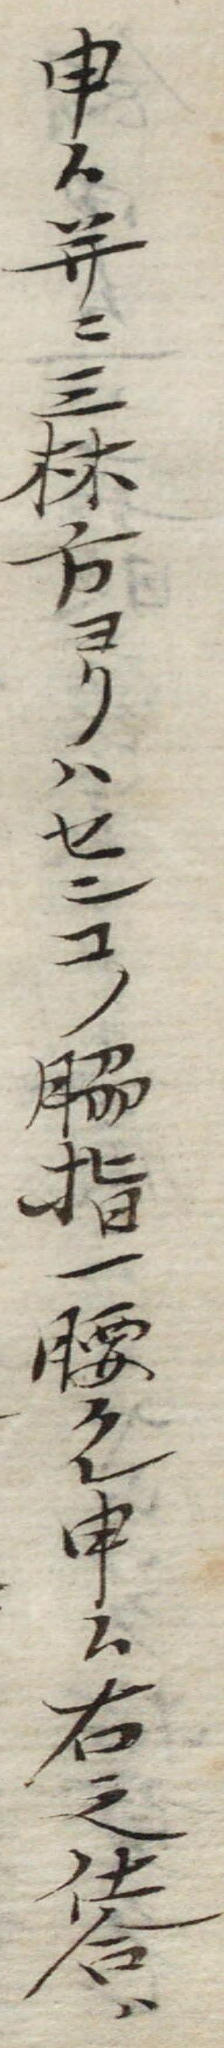申候幷ニ三林方ヨリハセンコノ脇差一腰クレ申候右之仕合ハ
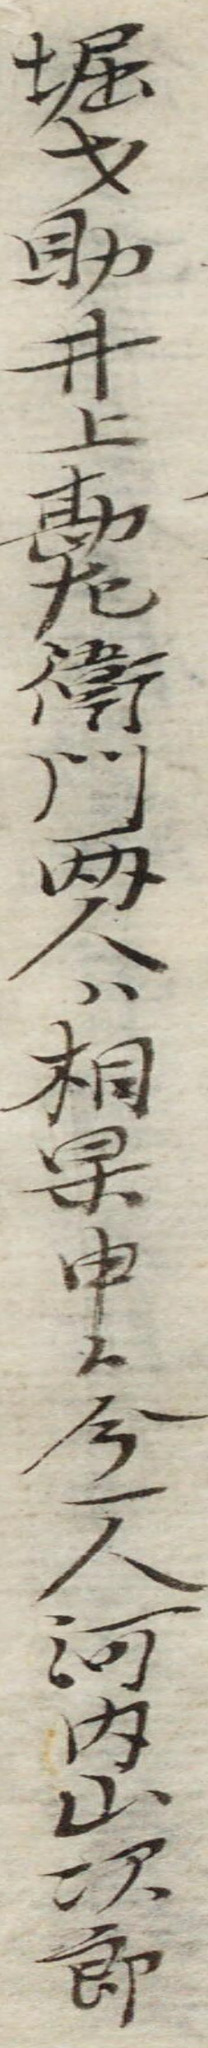堀才助井上勘左衛門両人ハ相果申候今一人河内山次郎
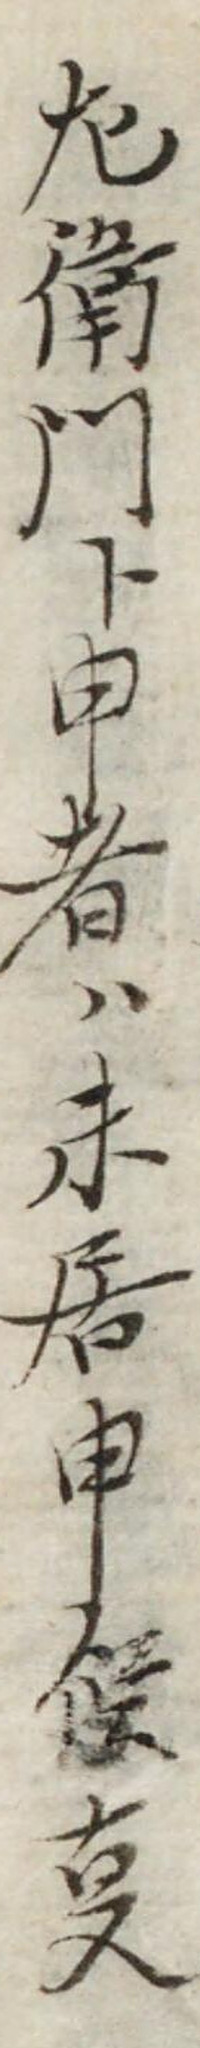左衛門ト申者ハ未居申候事
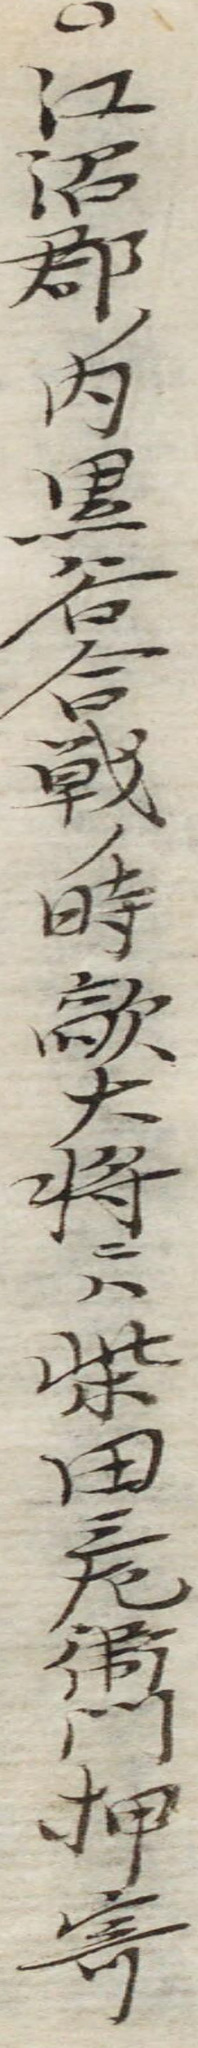〇江沼郡ノ内黒谷合戦ノ時敵大将ニハ柴田三左衛門押寄
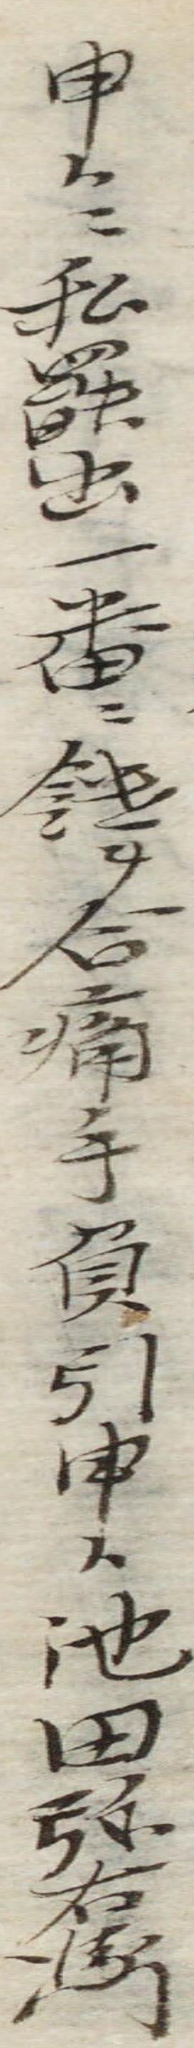申候ニ私罷出一番ニ鑓ヲ合痛手負引申候池田弥右衛門
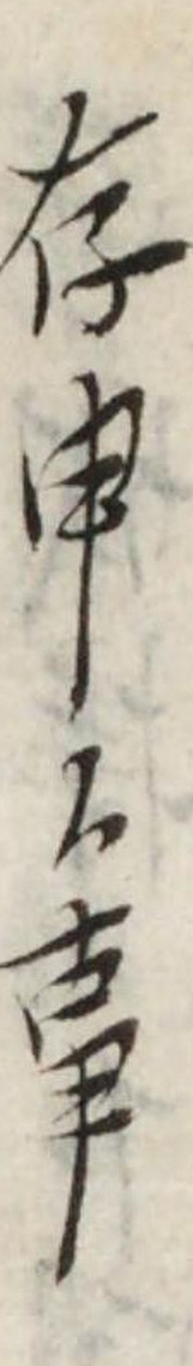存申候事
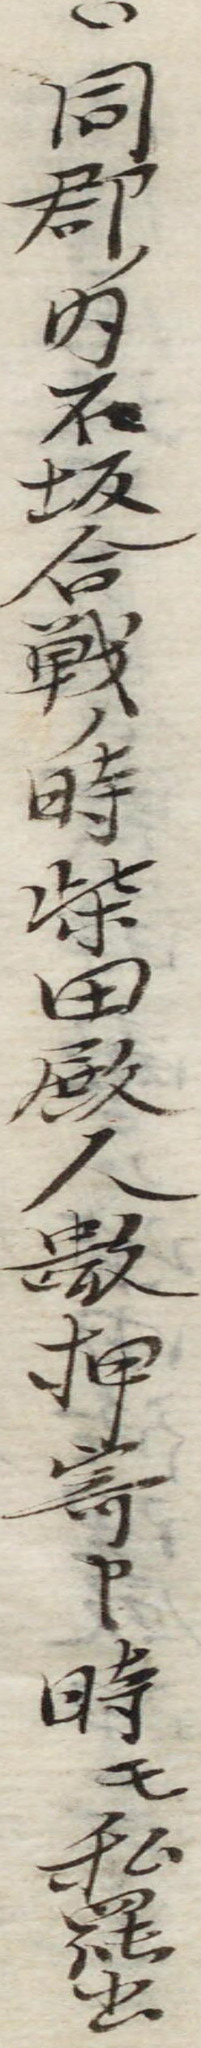〇同郡ノ内石坂合戦ノ時柴田殿人数押寄申時モ私罷出
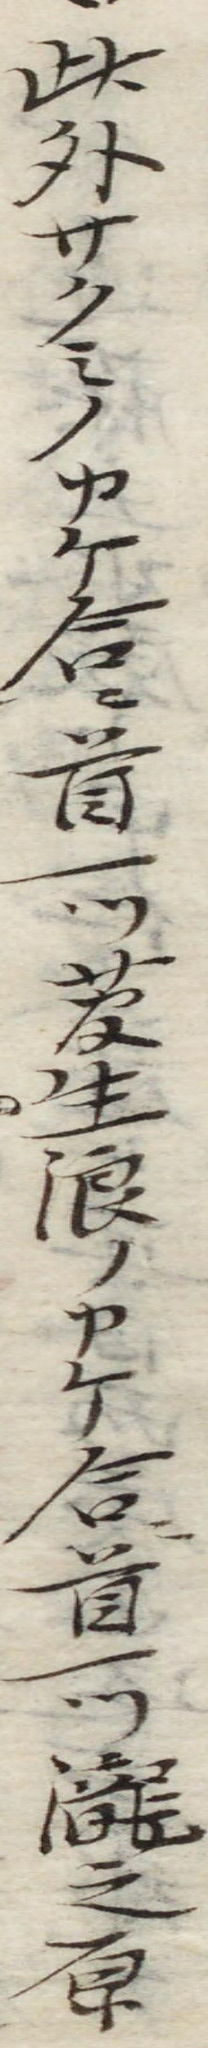〇此外サク之ノカケ合ニ首一ツ菅生浪ノカケ合首一ツ瀧之原
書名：聞見雑録
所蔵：Ishikawa Prefectural Library
